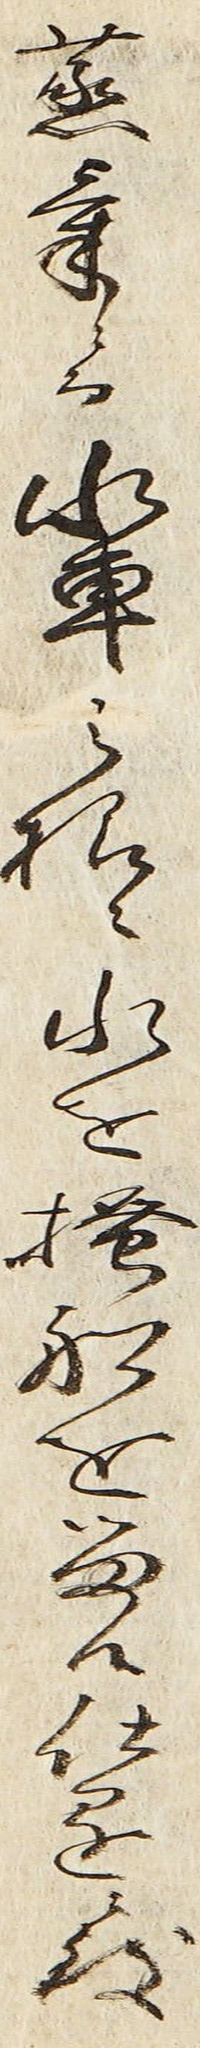蒸気に而水車之様に水を搔船を留候詞仕懸に致
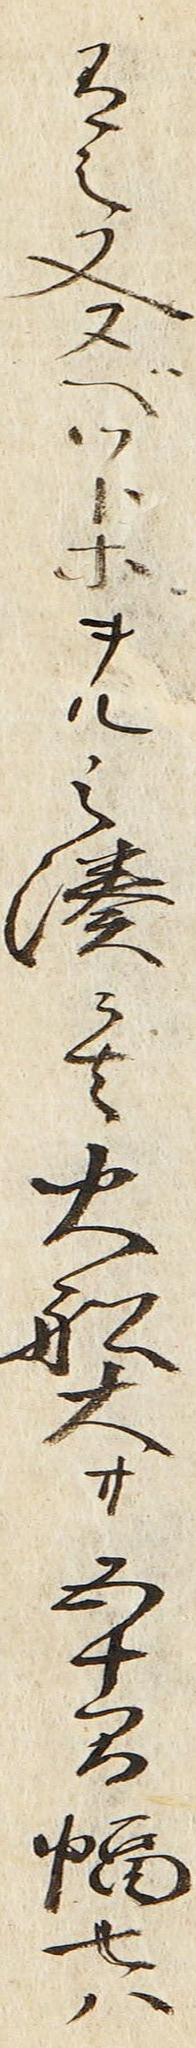有之又ヌベツトホヲル之湊には火船大さ五十間幅七八
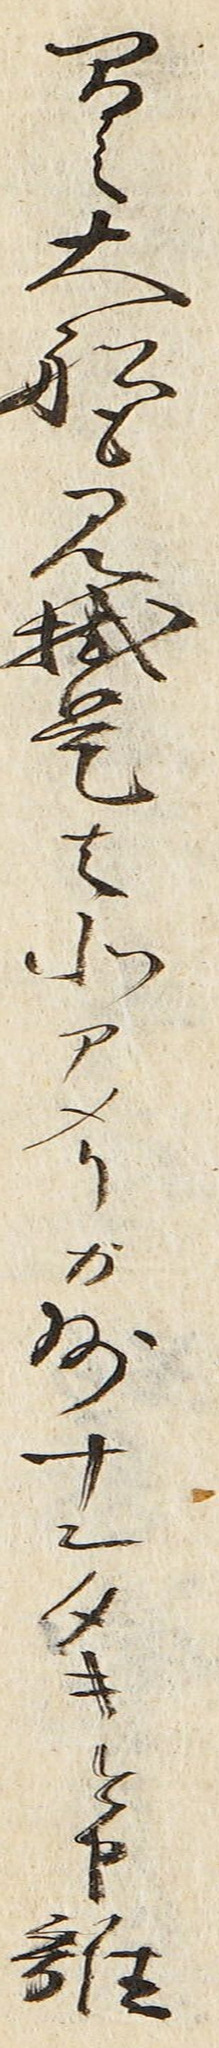間之大船も見掛是は北アメリカ州ナンタキと申離
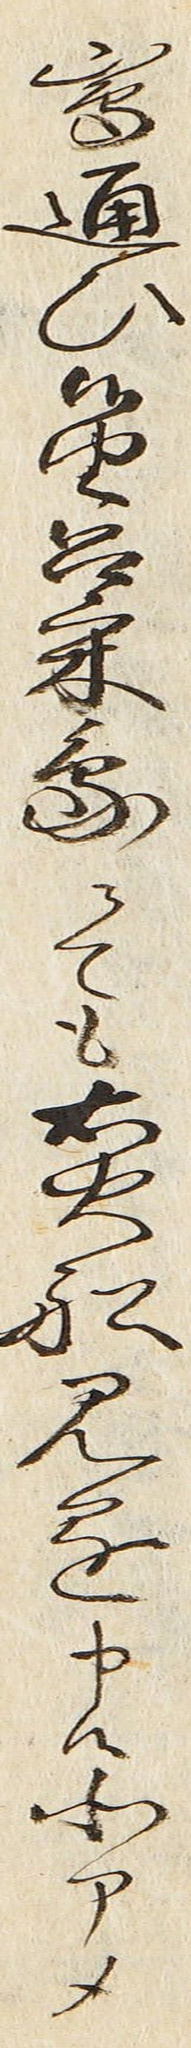嶌通ひ候由呂宋島にても右火船見懸申候北アメ
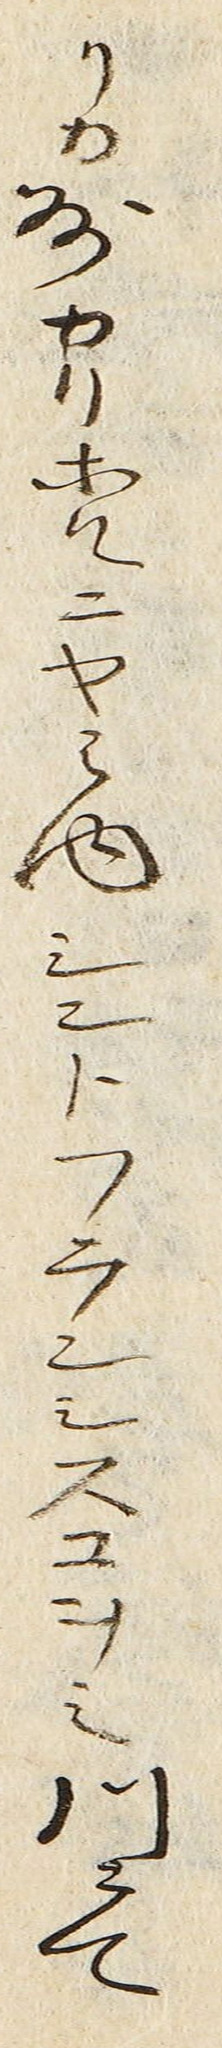リカ州カリホルニヤ之内シントフランシスコヲ之川にて
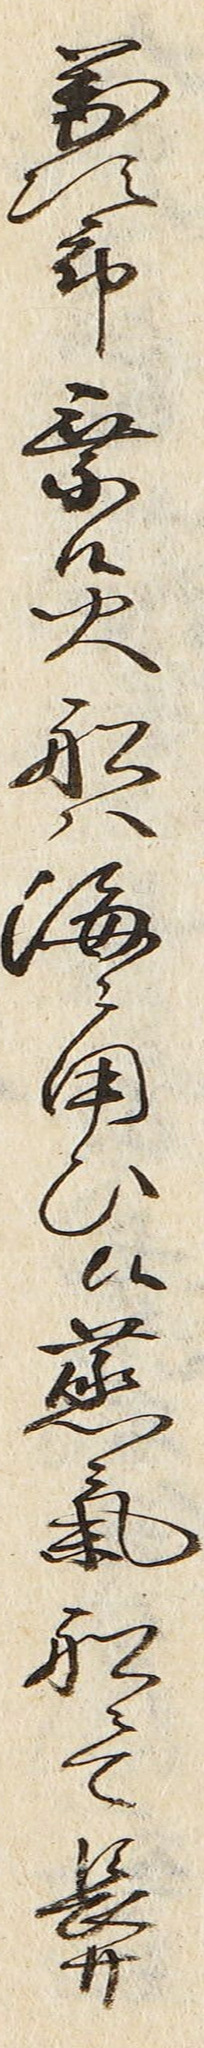万次郎乗候火船は海に用ひ候蒸気船にて長さ
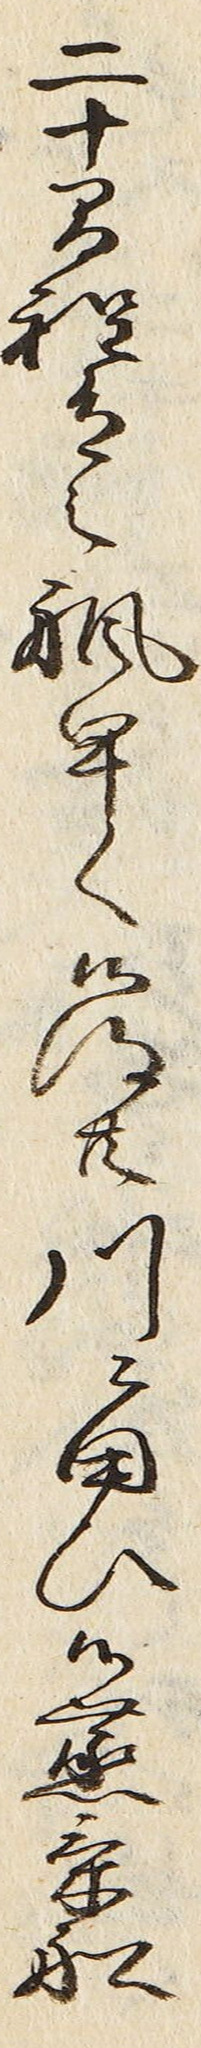二十間程有之䑺早く候得共川に用ひ候蒸気船
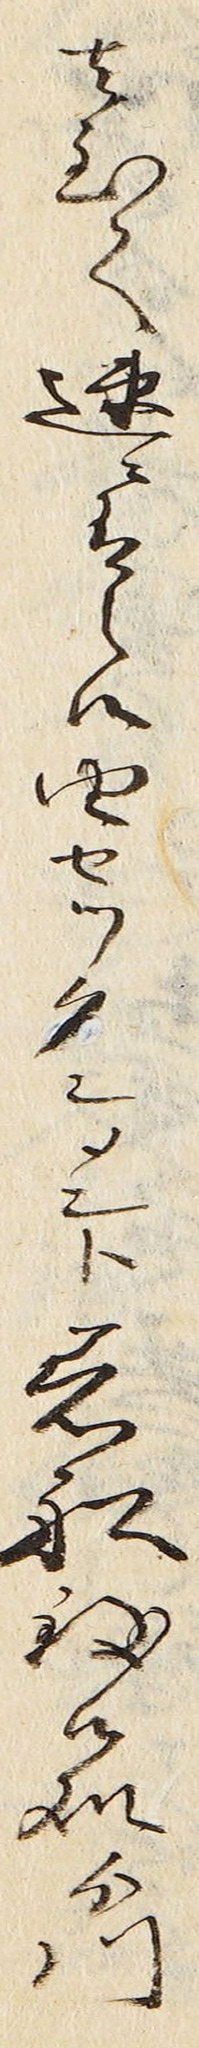は至て速に有之候由セツクンメント着船致候処ゟ川
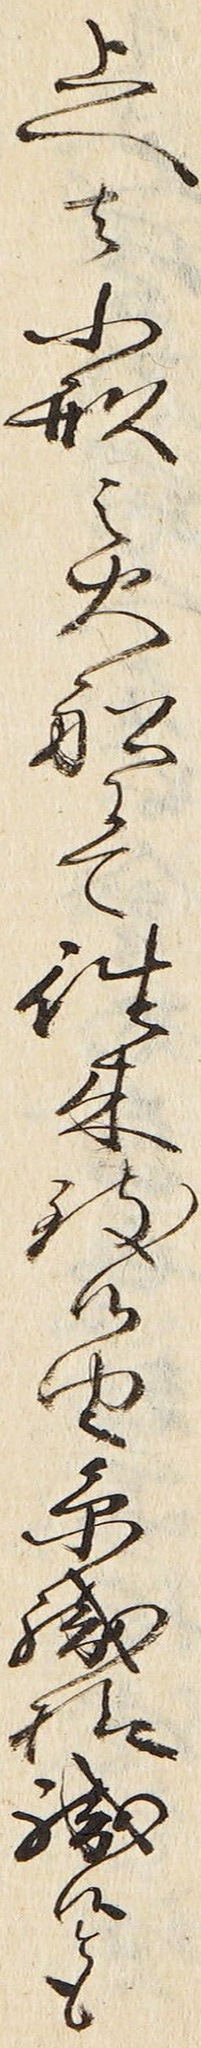上へは小形之火船にて往来致候由糸織様織候とも
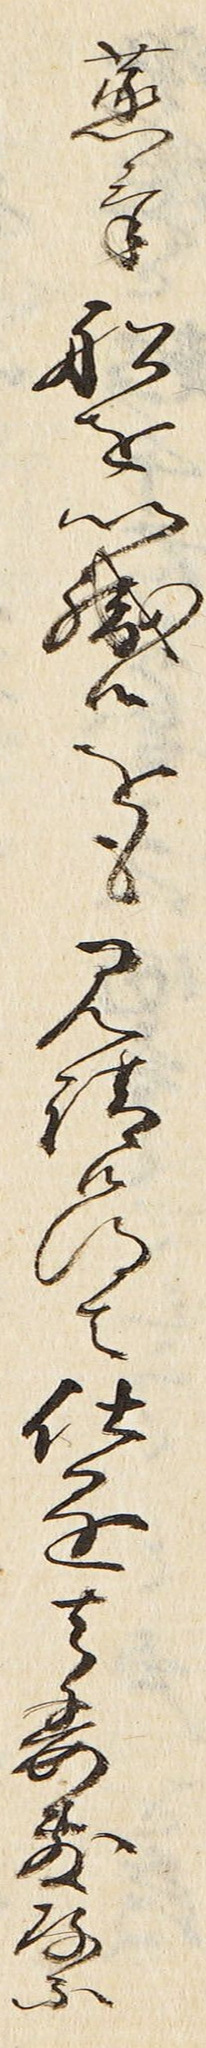蒸気船を以織候とも見請候得は仕懸は委敷存不
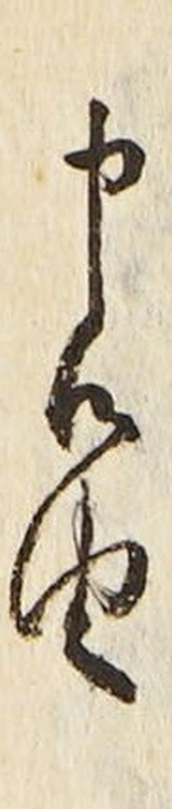申候由
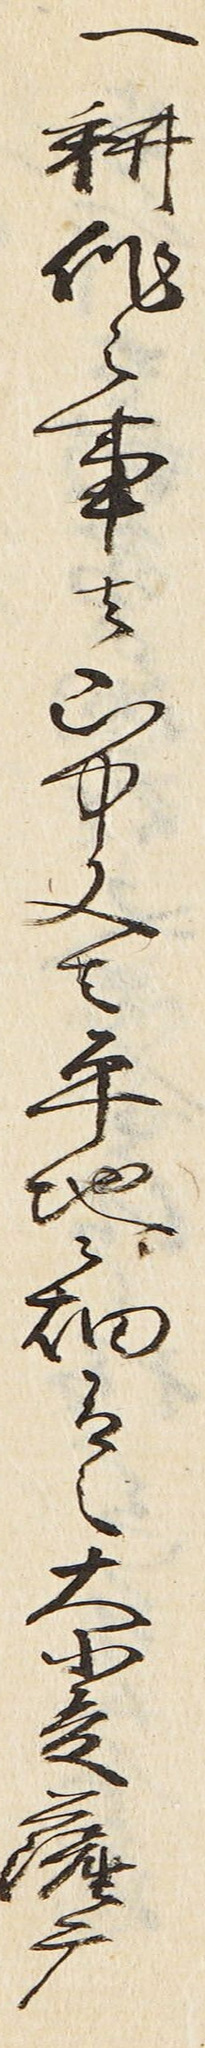一耕作之事は山中又は平地に畑有之大小麦薩摩
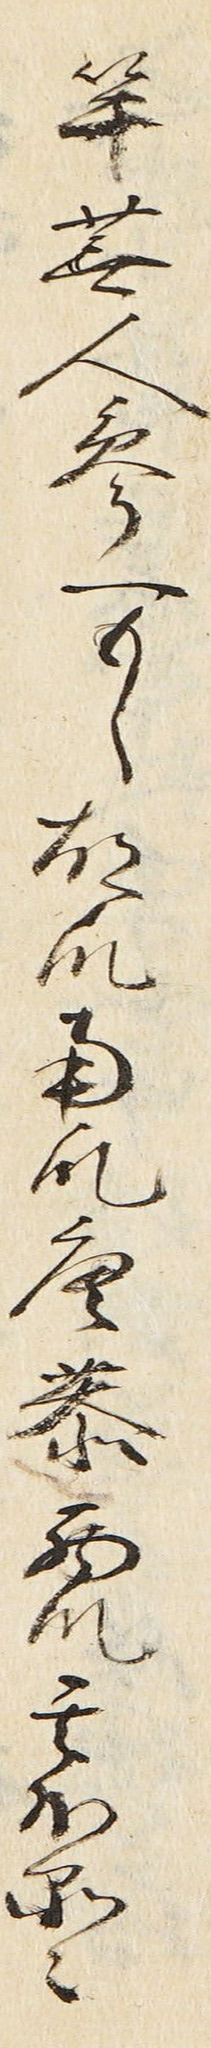芋蕪人参一もく胡瓜南瓜唐黍西瓜其外品々
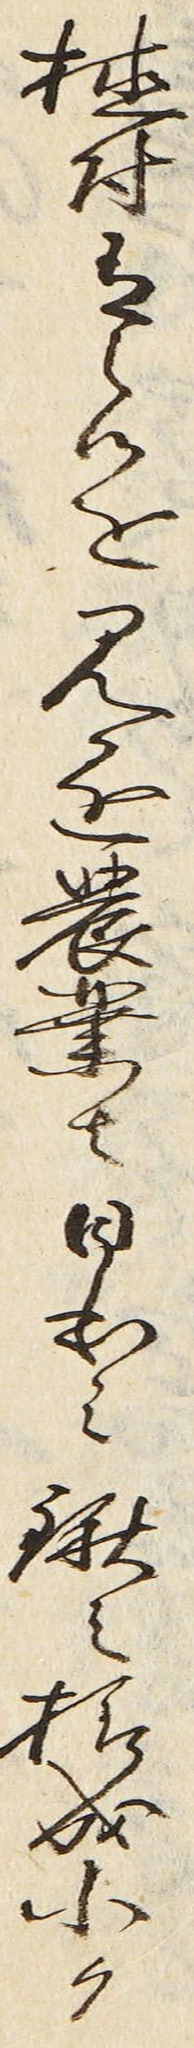植付有之候を見懸農業は日本之鍬之様成小く
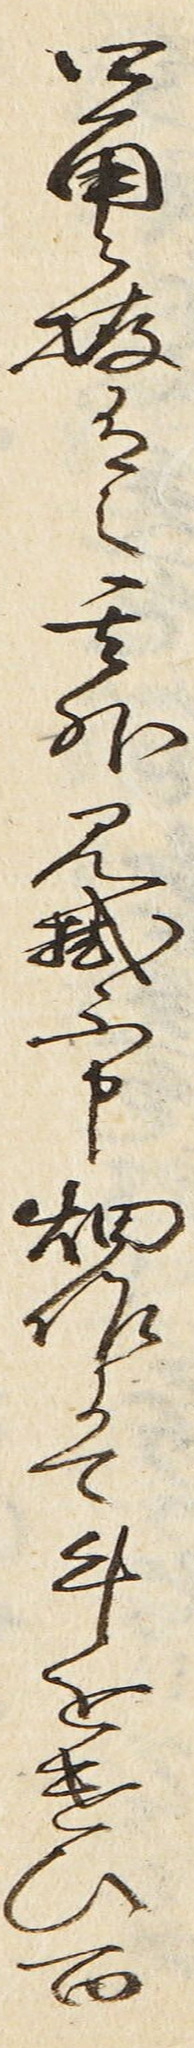四角に拵有之其外見掛不申畑作にて牛を遣い百
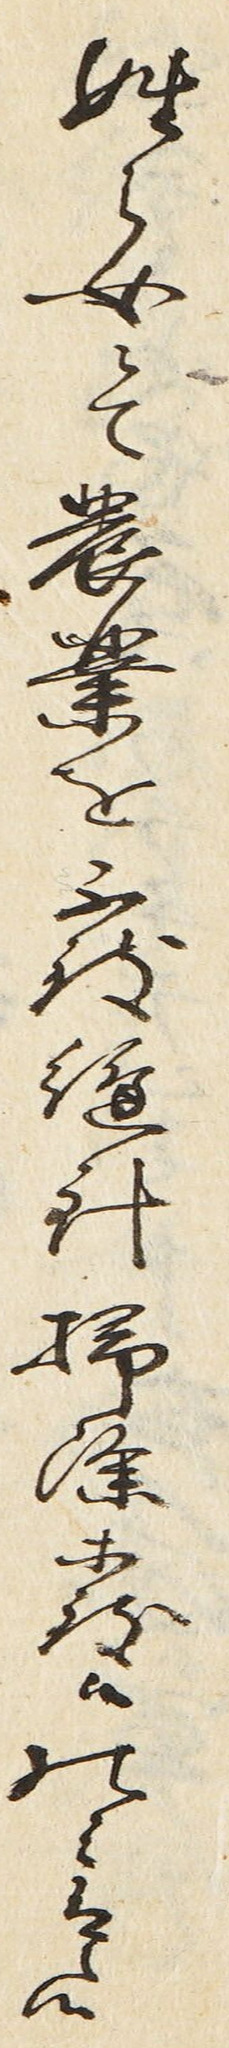姓之女にて農業を不致縫針掃除等致候のみ有之候
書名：土佐中浜万次郎漂流記
